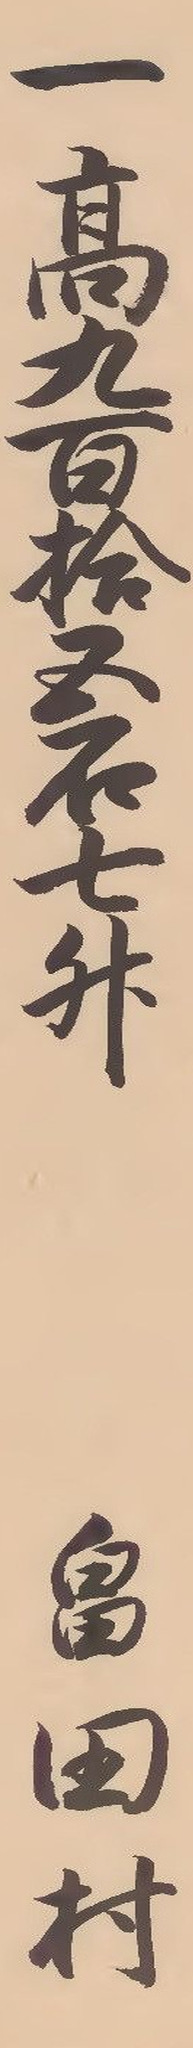一髙九百拾五石七升畠田村
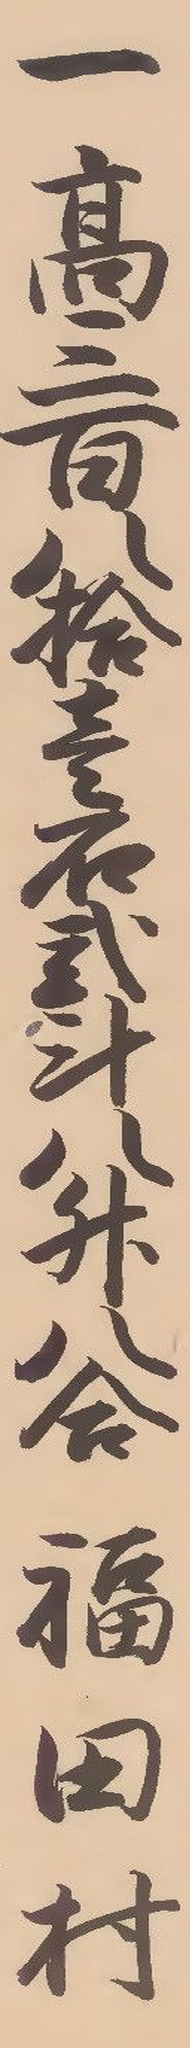一髙三百八拾壱石弐斗八升八合福田村

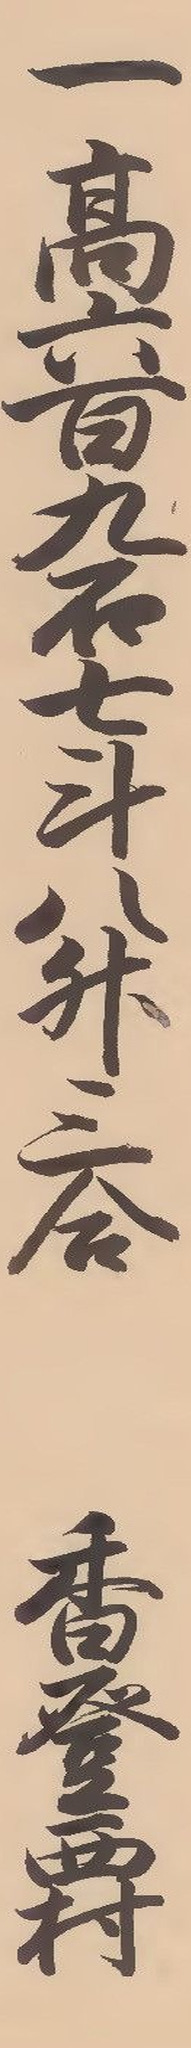一髙六百九石七斗八升三合香登西村
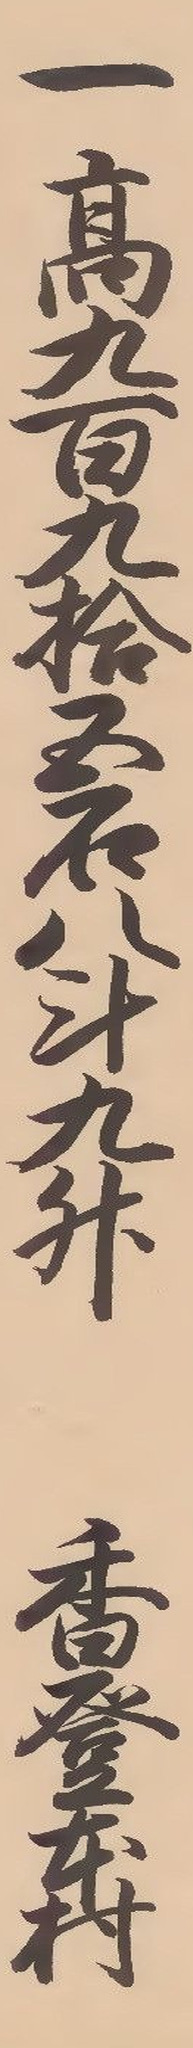一髙九百九拾五石八斗九升香登本村
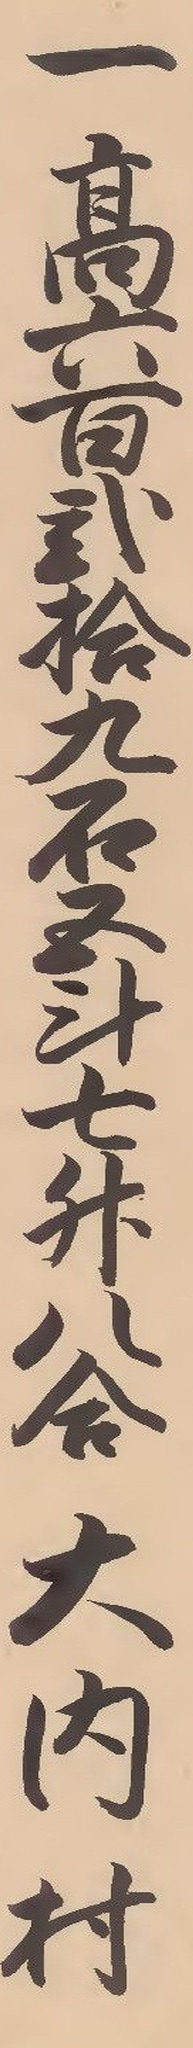一髙六百弐拾九石五斗七升八合大内村
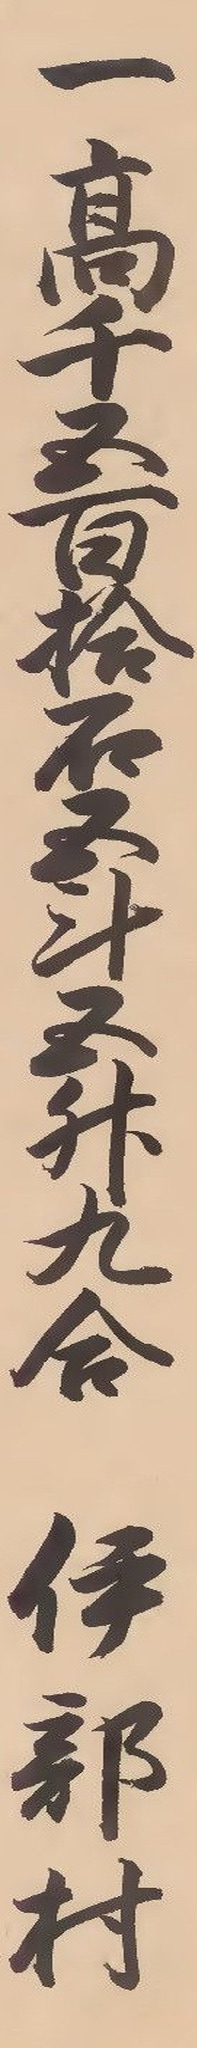一髙千五百拾石五斗五升九合伊部村
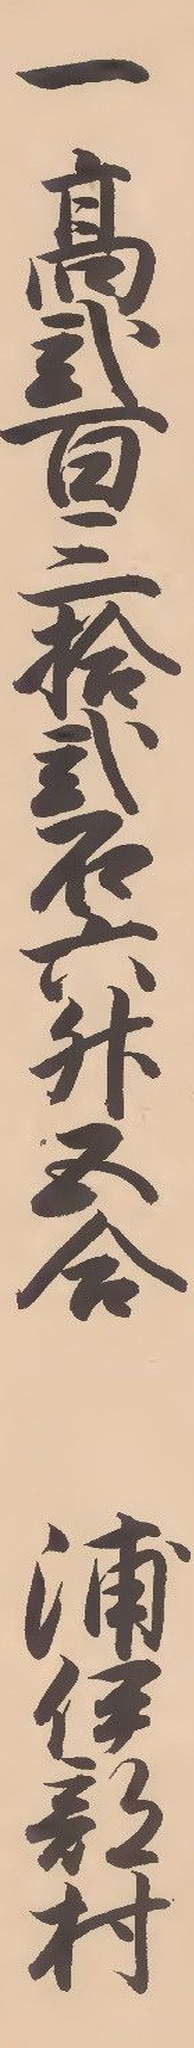一髙弐百三拾弐石六升五合浦伊部村
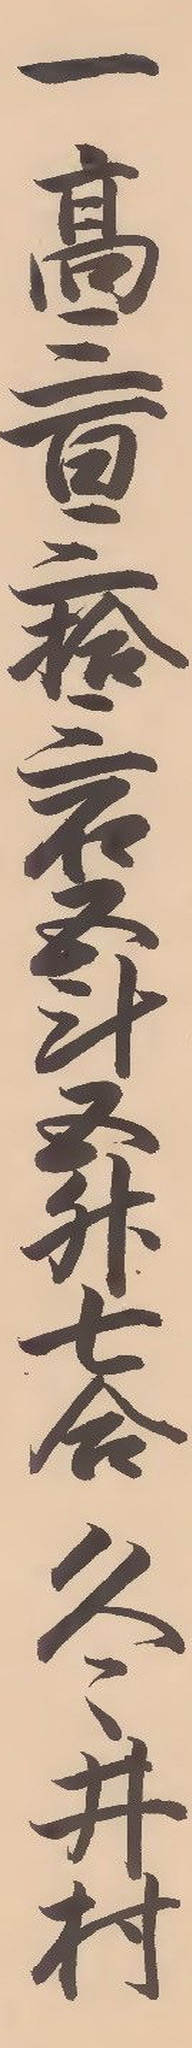一髙三百三拾三石五斗五升七合久々井村
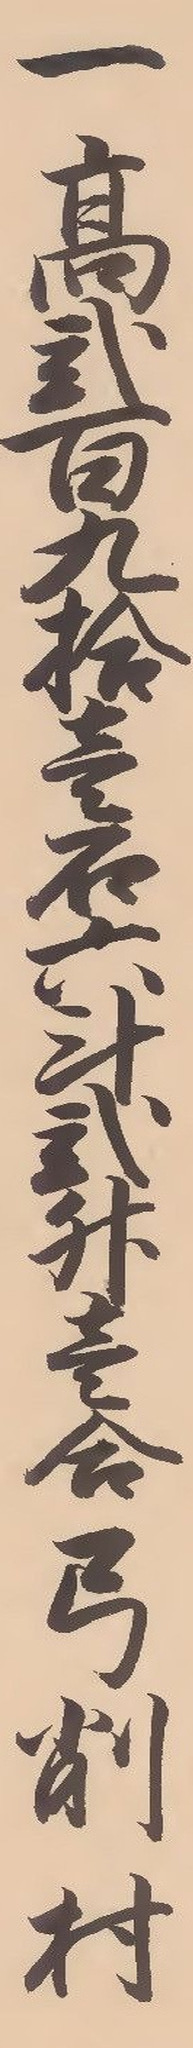一髙弐百九拾壱石六斗弐升壱合弓削村
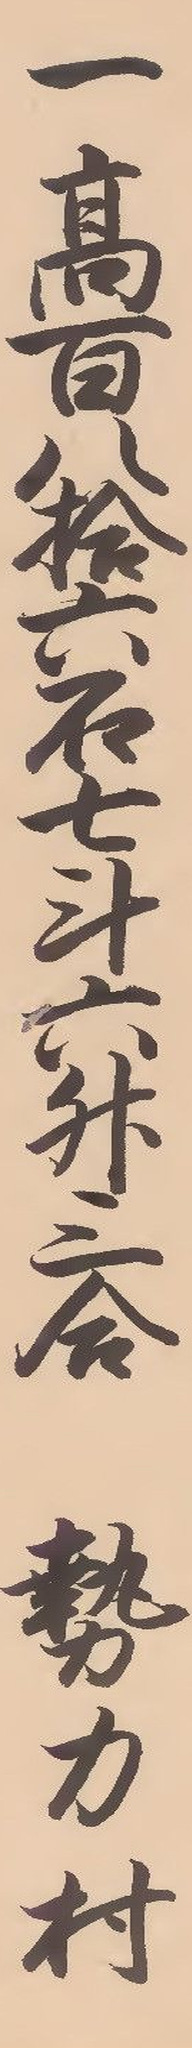一髙百八拾六石七斗六升三合勢力村

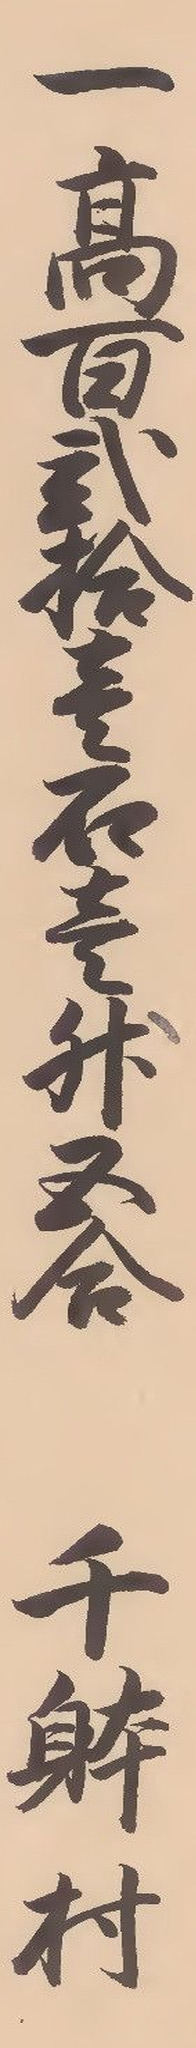一髙百弐拾壱石壱升五合千躰村
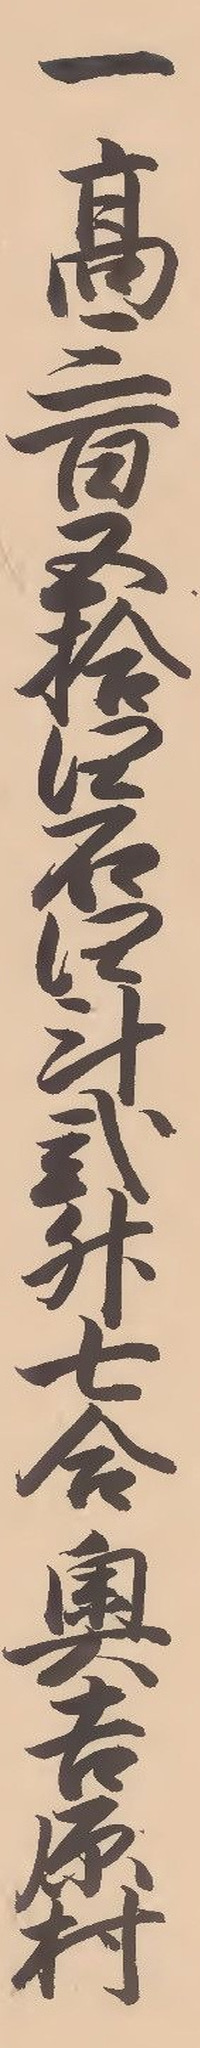一髙三百五拾四石四斗弐升七合奥吉原村
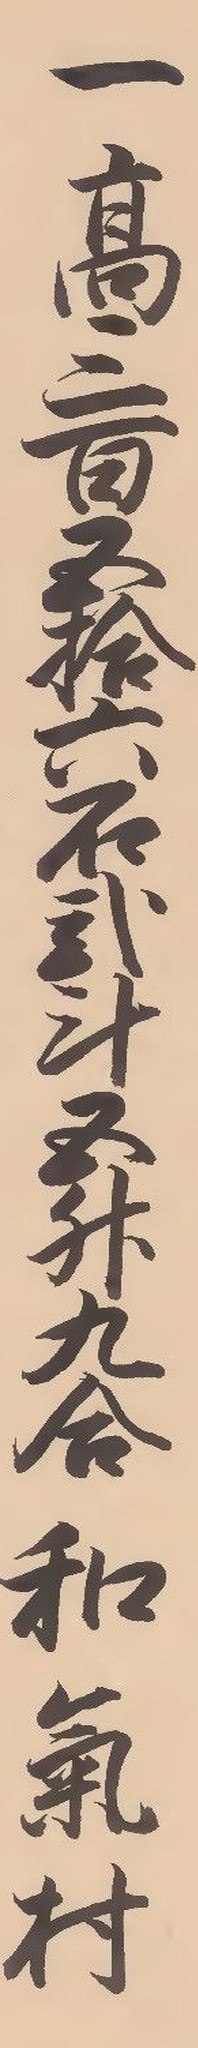一髙三百五拾六石弐斗五升九合和氣村
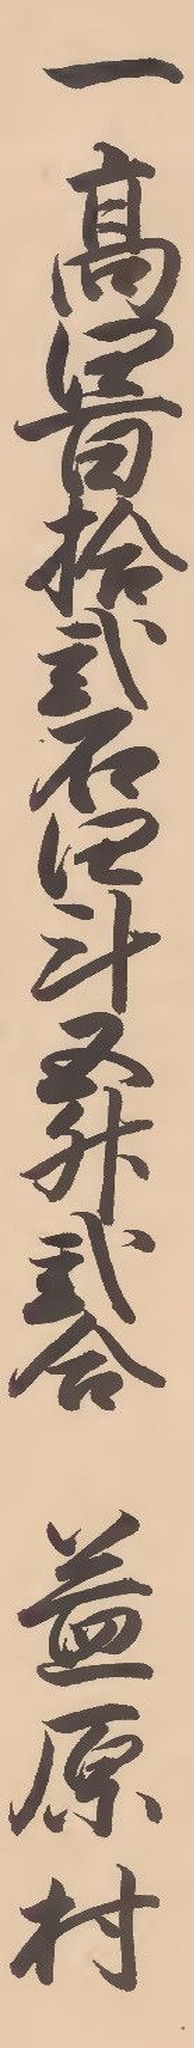一髙四百拾弐石四斗五升弐合益原村
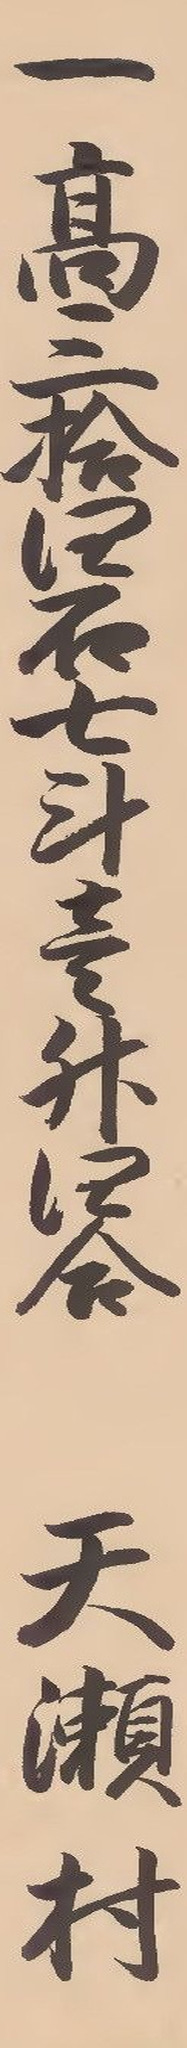一髙三拾四石七斗壱升四合天瀬村
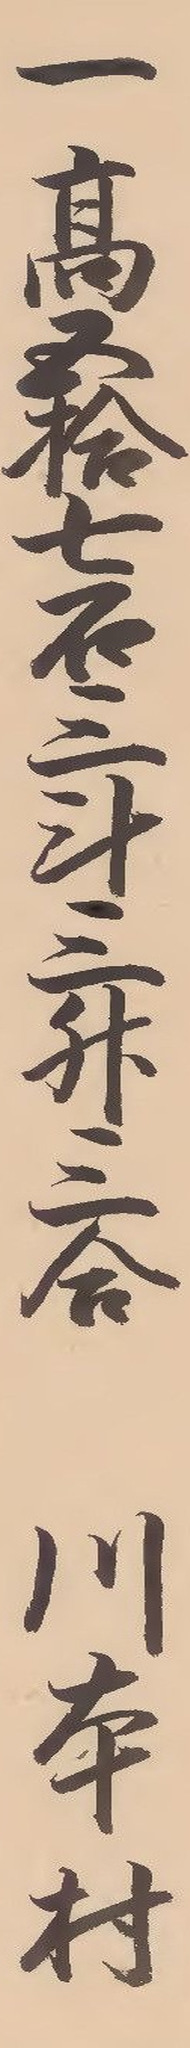一髙五拾七石三斗三升三合川本村
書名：備前国郷帳
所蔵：国立公文書館 National Archives of Japan
